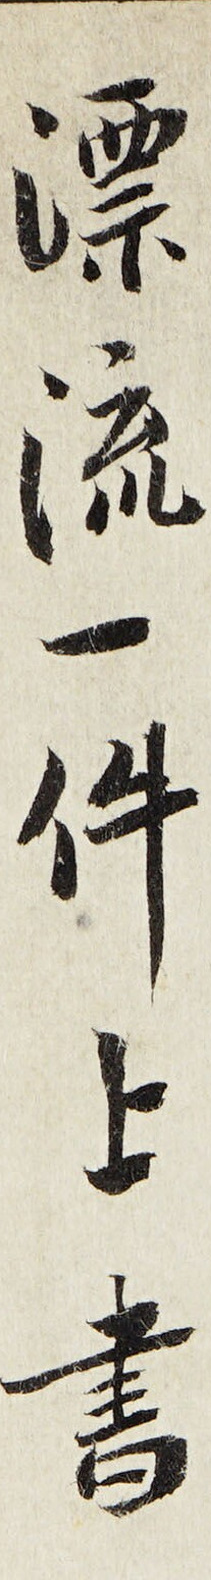漂流一件上書

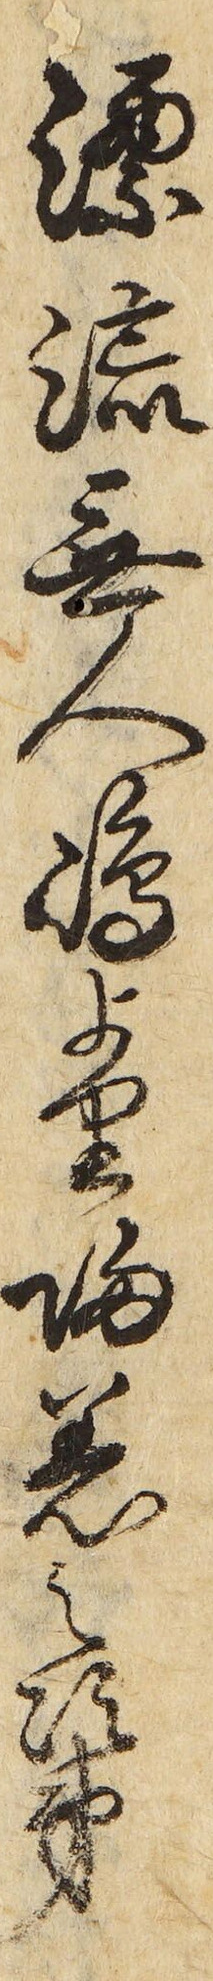漂流無人島より帰着之次第
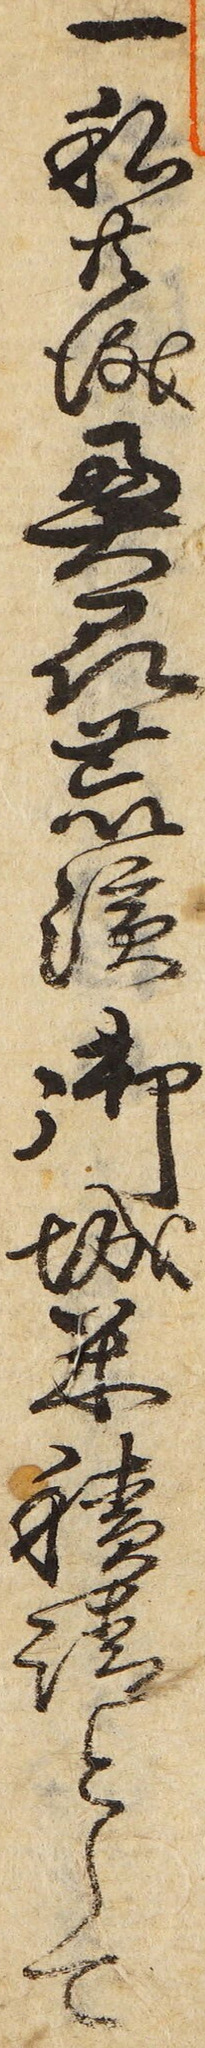一私共儀奥州荒浜御城米積請として
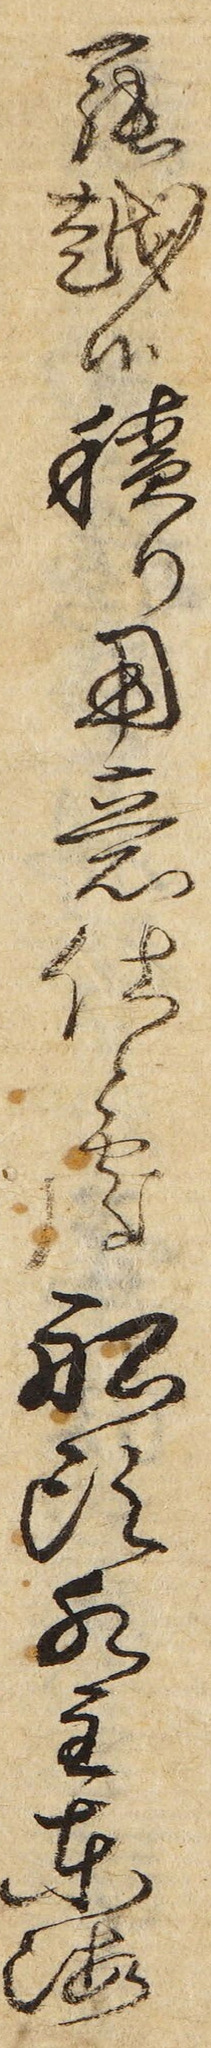罷越候積り用意仕候処船頭水主東海
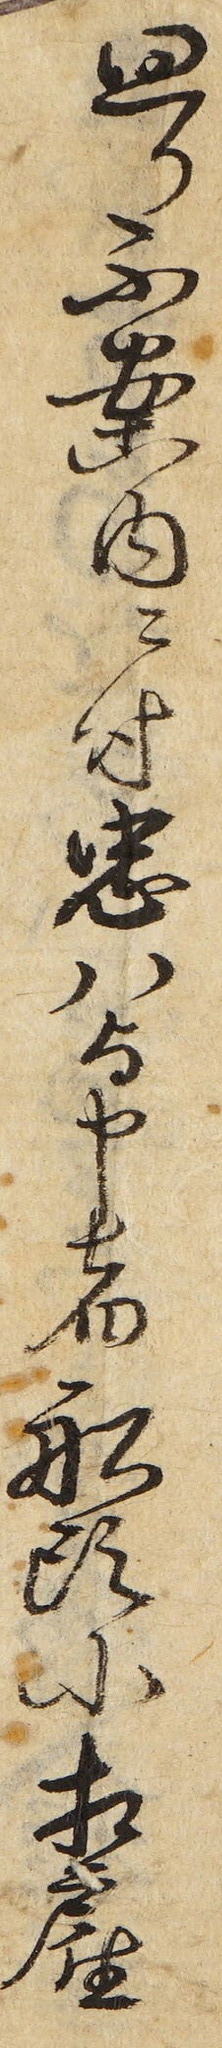廻り不案内ニ付忠八与申者船頭に相雇
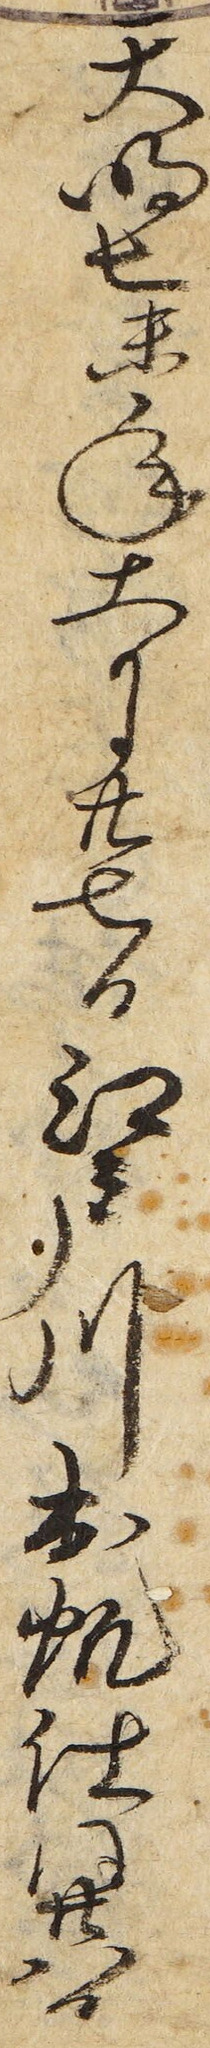天明七未年十一月廿七日江戸川出帆仕同廿八日
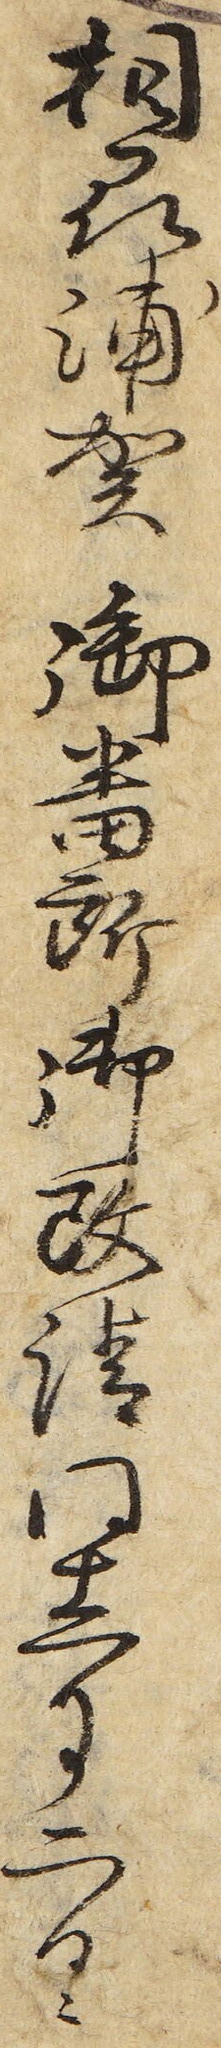相州浦賀御番所御改請同十二月二日ニ
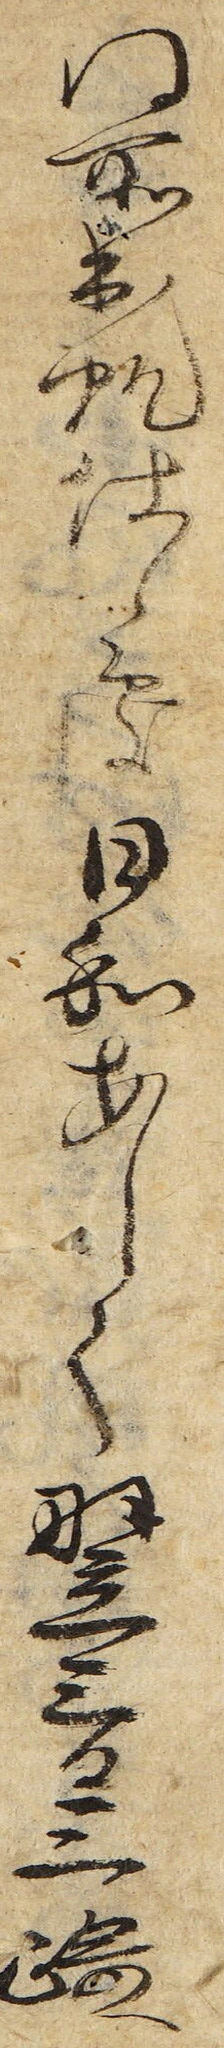同所出帆仕候処日和あしく翌三日三崎へ
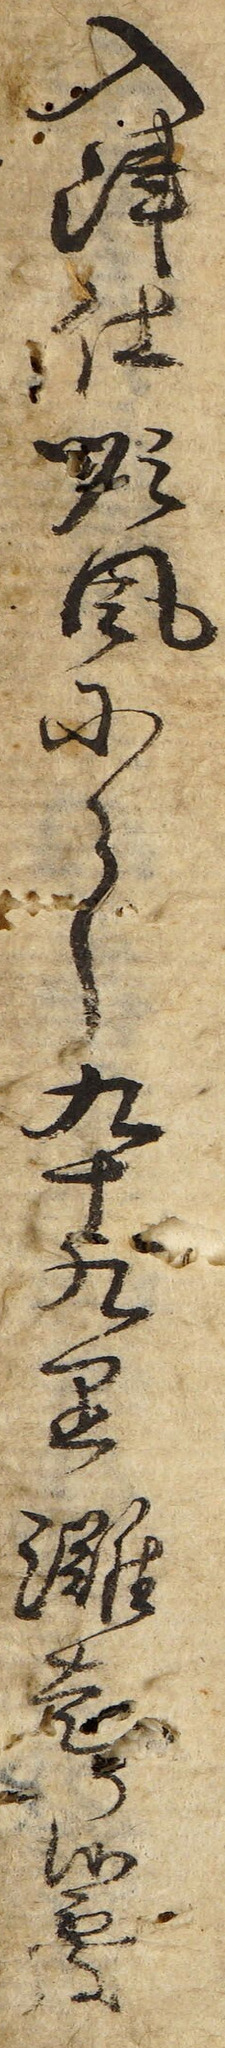入津仕順風にて九十九里灘走り候処

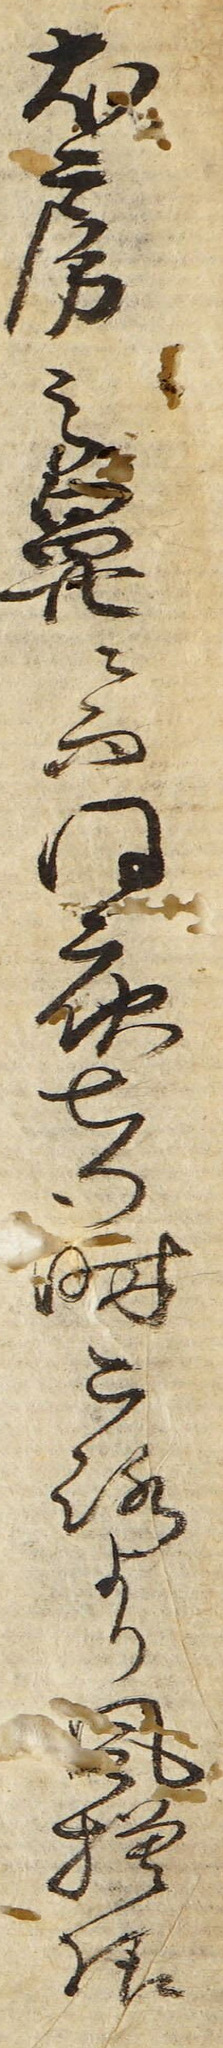犬房之鼻ニ而同夜七ツ時ころより風模様
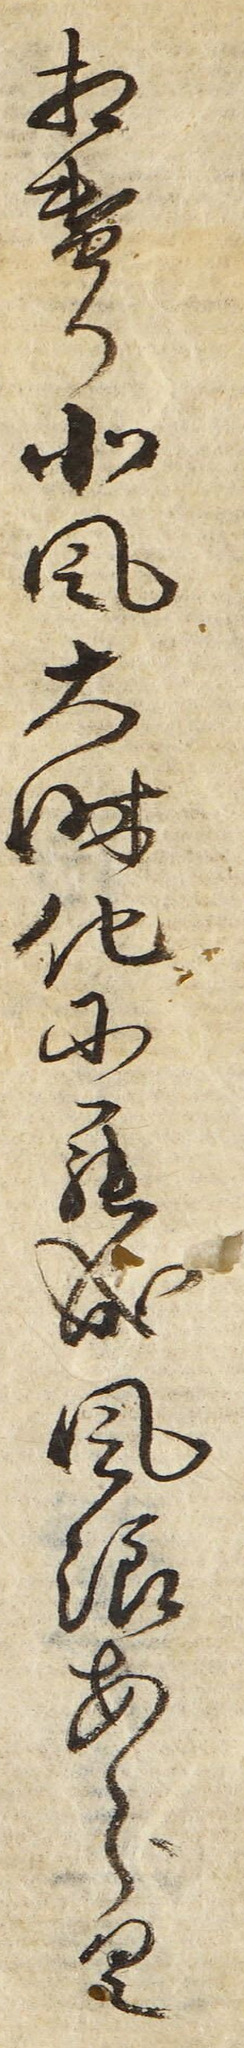相替り北風大時化に罷成風浪あらく
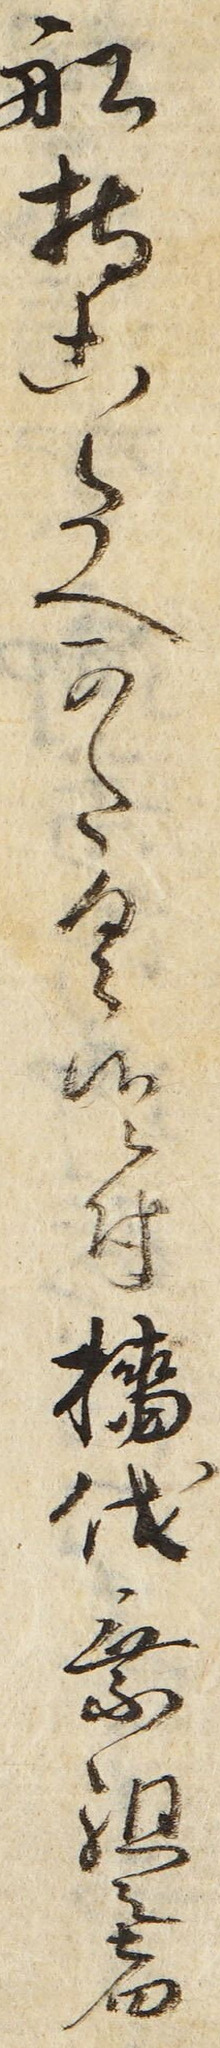船持こたへかたく候ニ付檣伐乗組之者
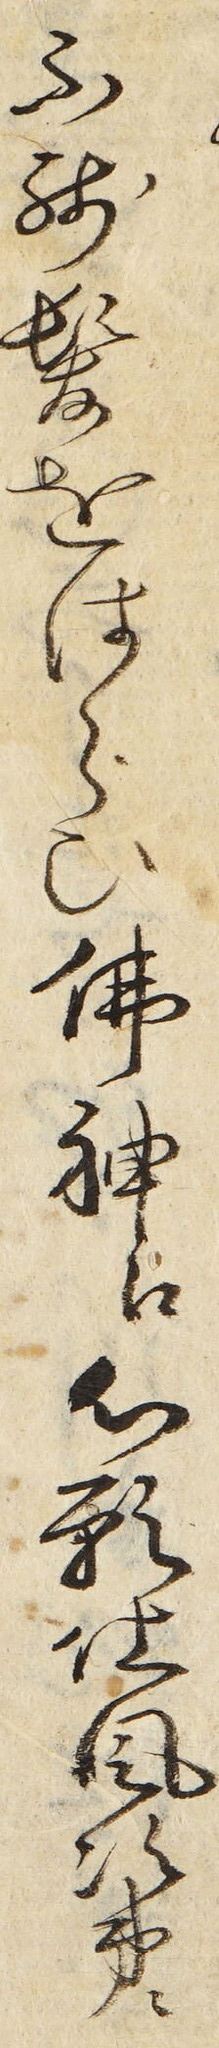不残髪をはらひ仏神江心願仕風次第ニ
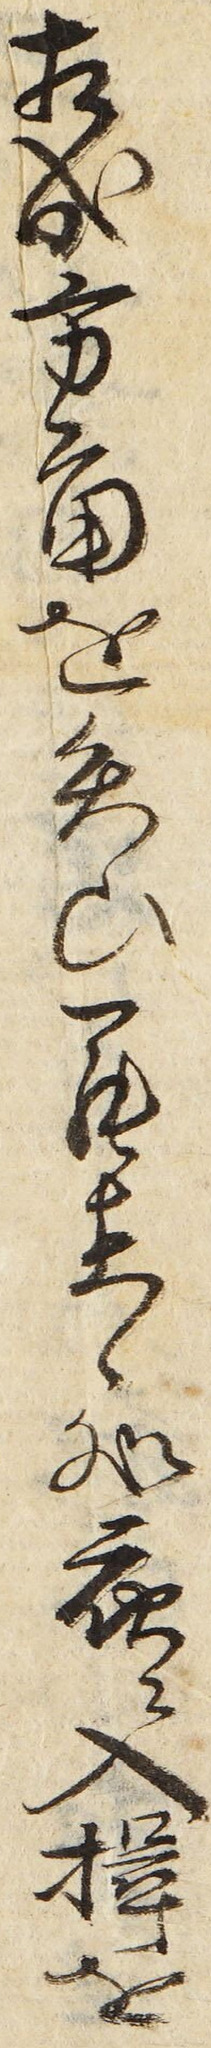相成方角を失ひ罷在候処夜ニ入楫を
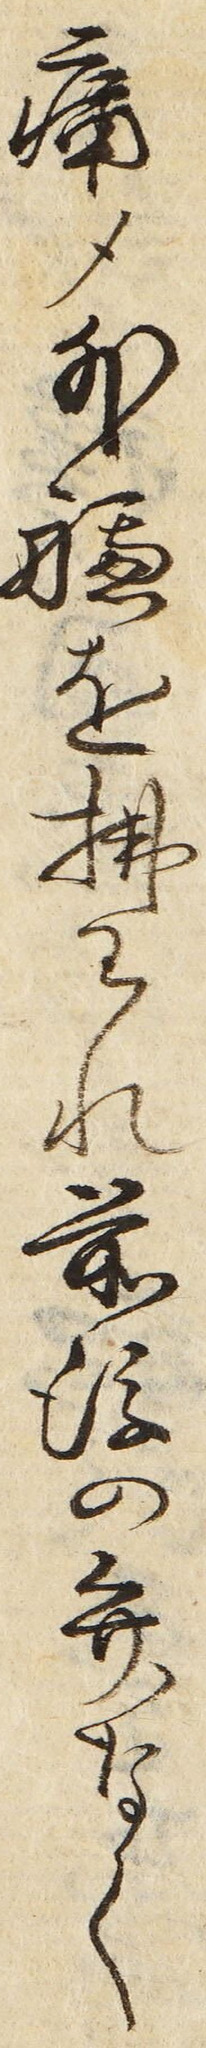痛メ外艫を払われ前後の弁なく
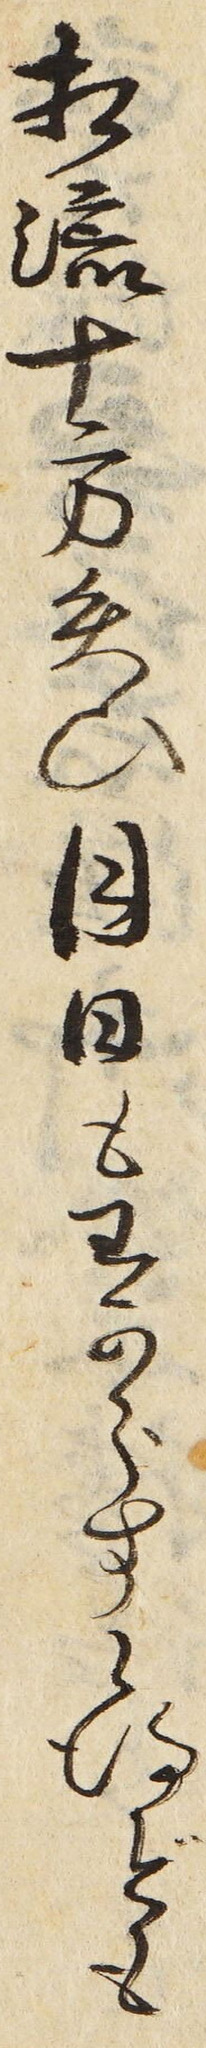相流十方失ひ月日もわからす候得ども
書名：漂流一件上書
